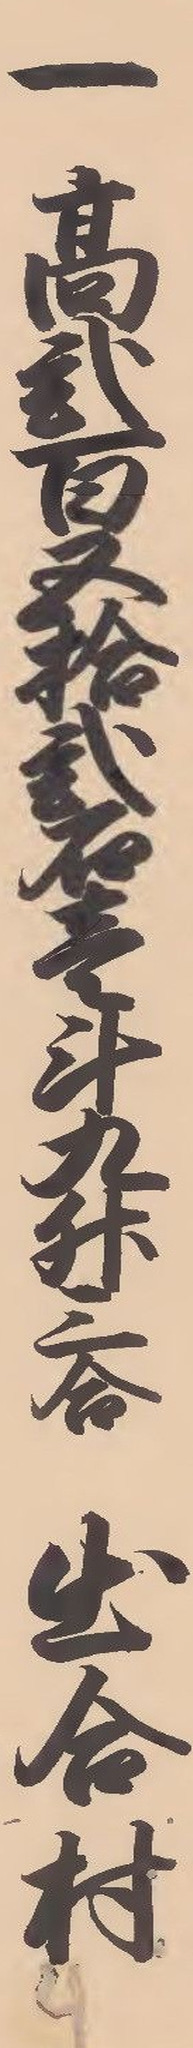一高弐百五拾弐石壱斗九升三合出合村
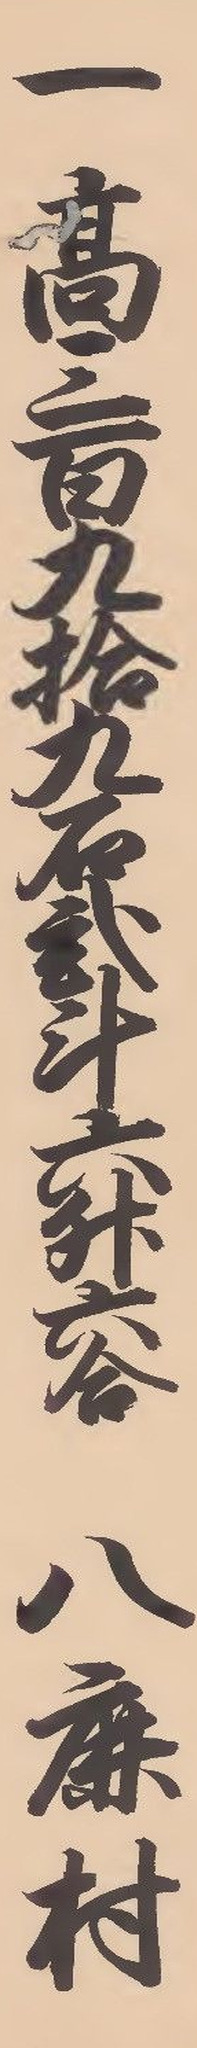一高三百九拾九石弐斗六升六合八鹿村
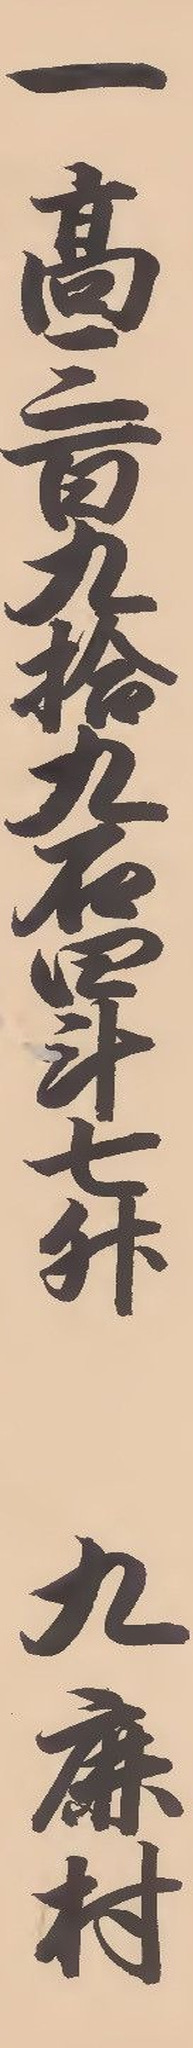一高三百九拾九石四斗七升九鹿村

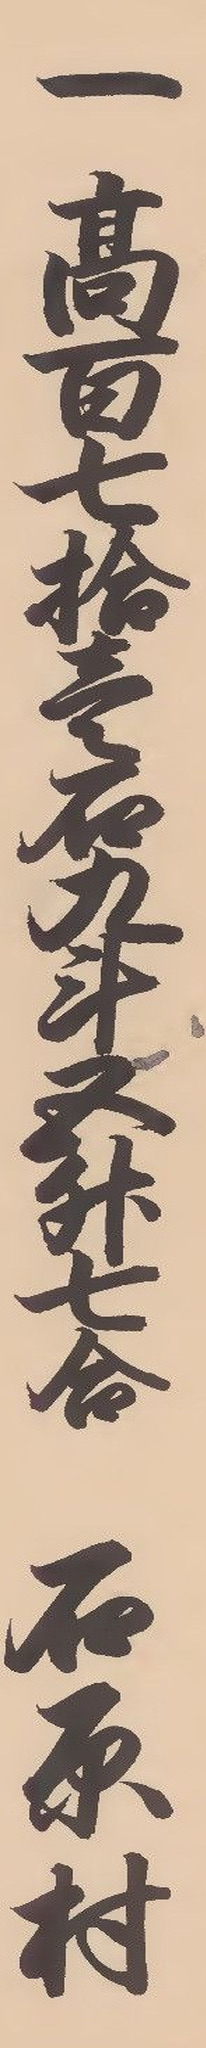一高百七拾壱石九斗五升七合石原村
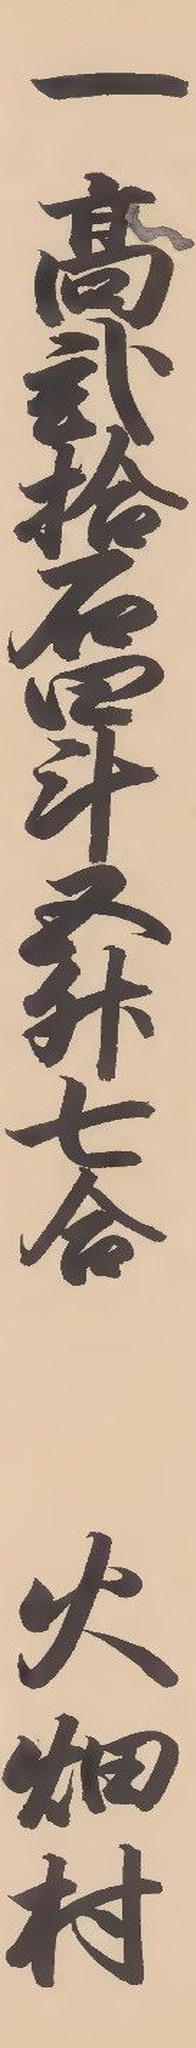一高弐拾石四斗五升七合火畑村
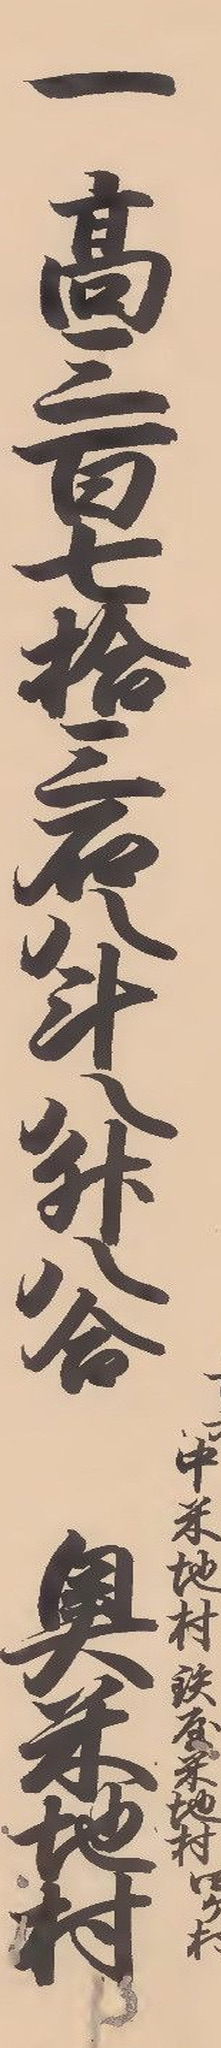一高三百七拾三石八斗八升八合奥米地村
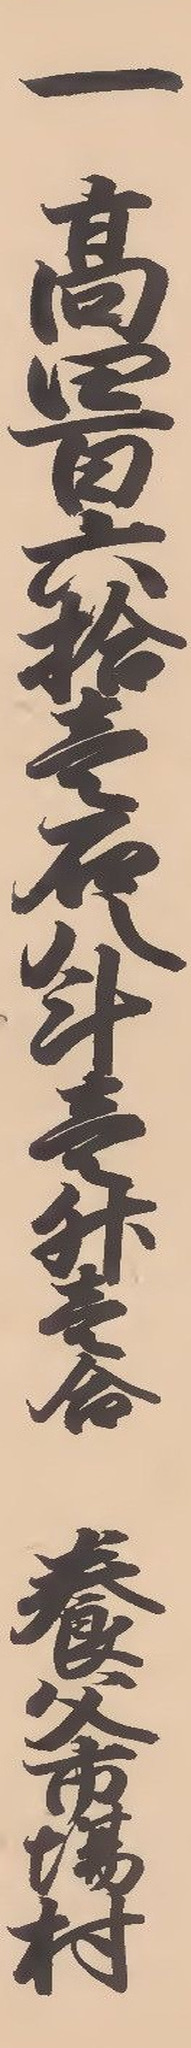一高四百六拾壱石八斗壱升壱合養父市場村
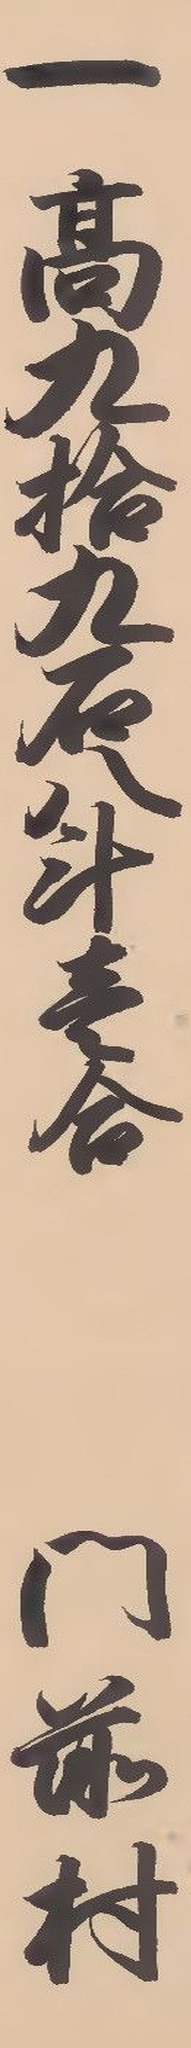一高九拾九石八斗壱合門前村
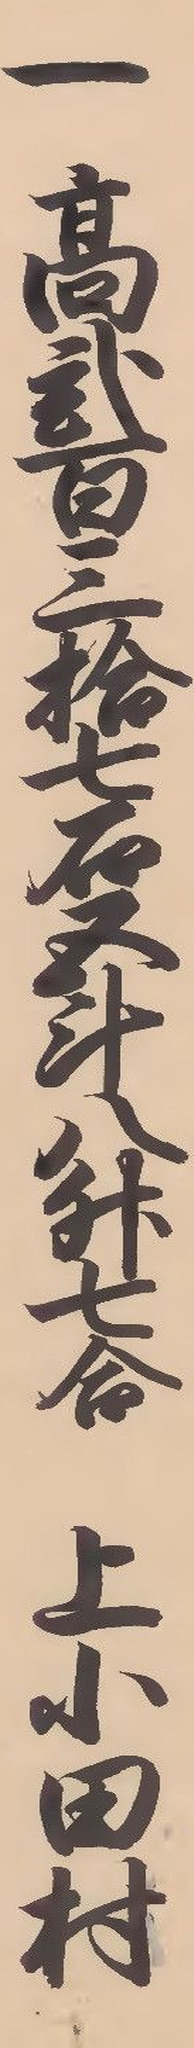一高弐百三拾七石五斗八升七合上小田村
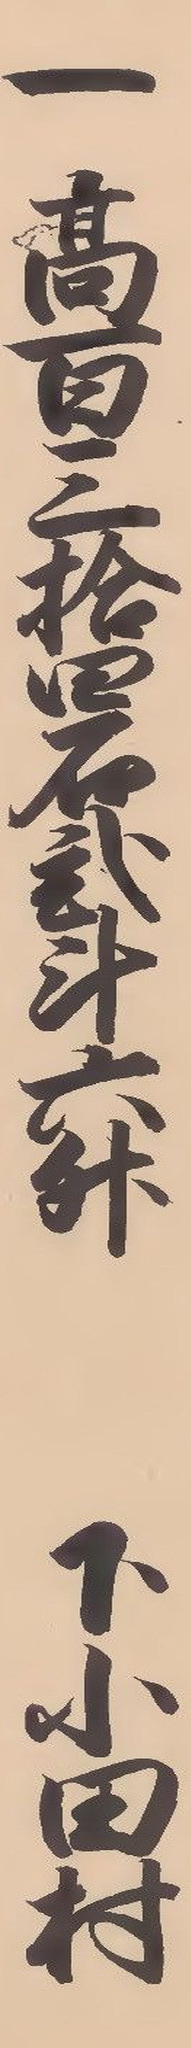一高百三拾四石弐斗六升下小田村
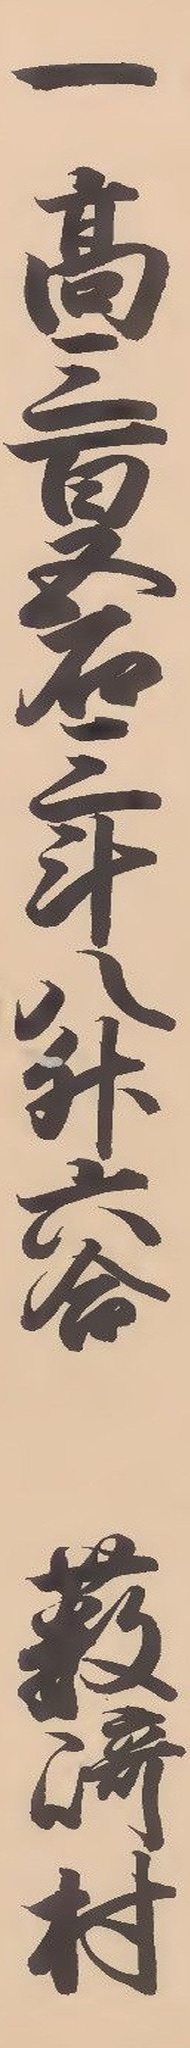一高三百五石三斗八升六合薮崎村

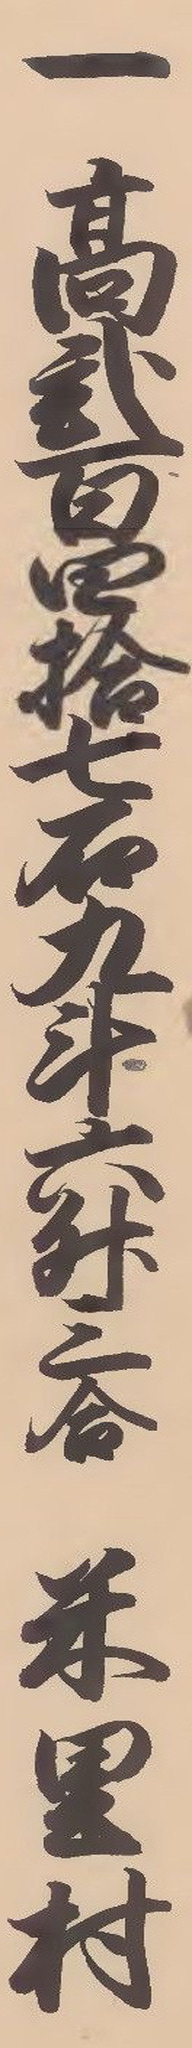一高弐百四拾七石九斗六升三合米里村
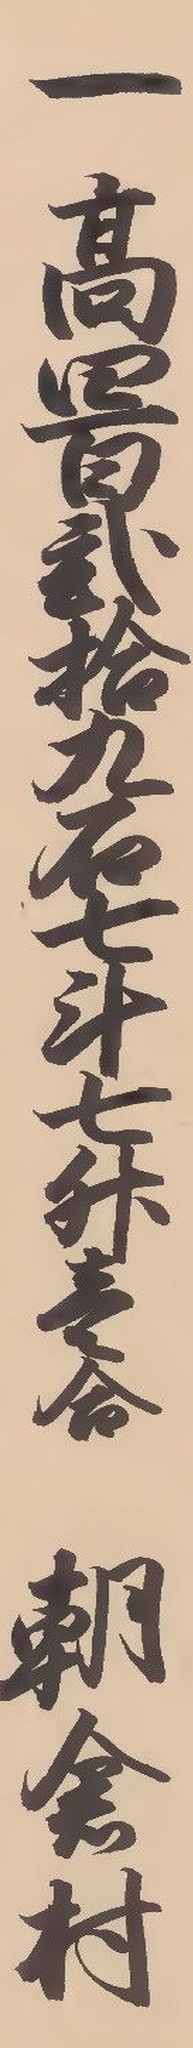一高四百弐拾九石七斗七升壱合朝倉村
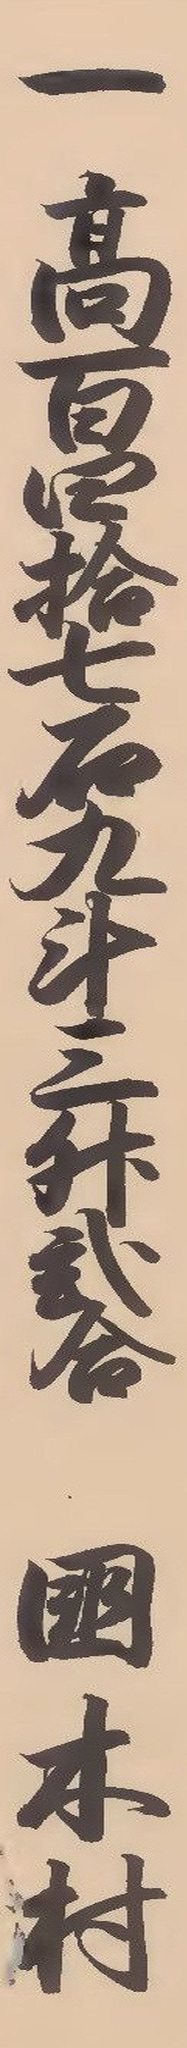一高百四拾七石九斗三升弐合国木村
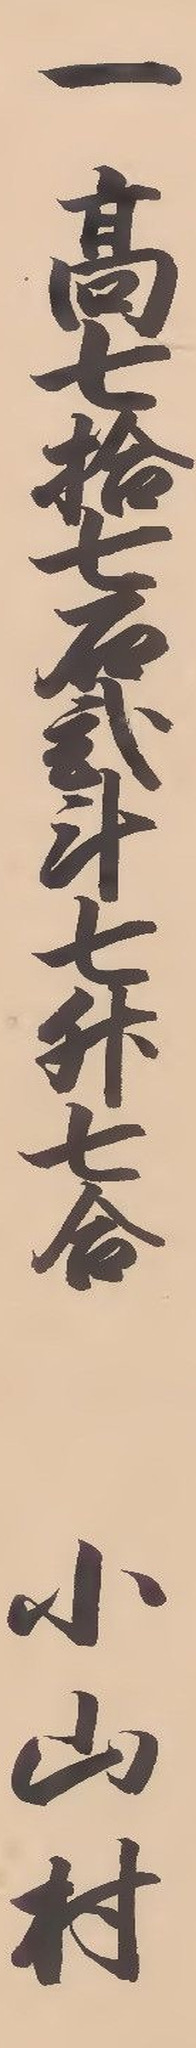一高七拾七石弐斗七升七合小山村
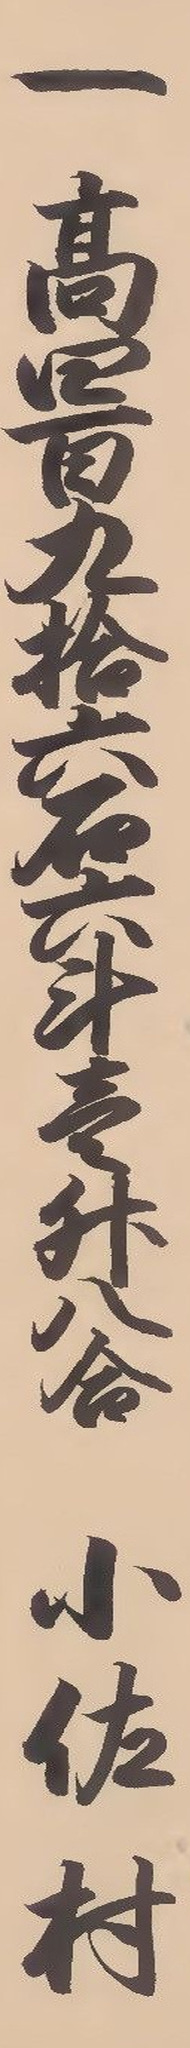一高四百九拾六石六斗壱升八合小佐村
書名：但馬国郷帳
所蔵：国立公文書館 National Archives of Japan
